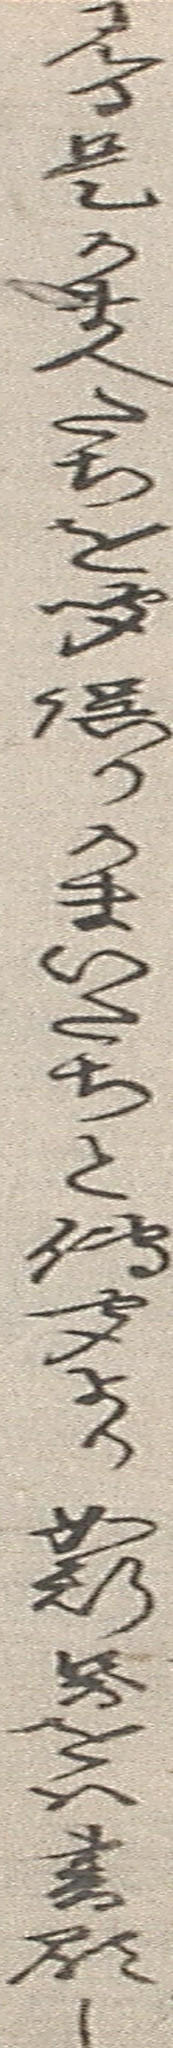見る是かまへたちを聞誤りかまいたちと伝聞より如斯図をハ書顕し
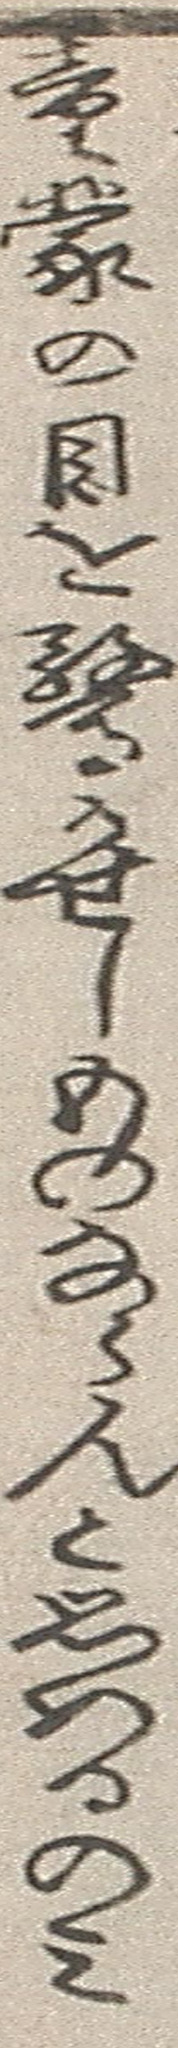童？蒙の目を驚かせしものならんと思わるのミ
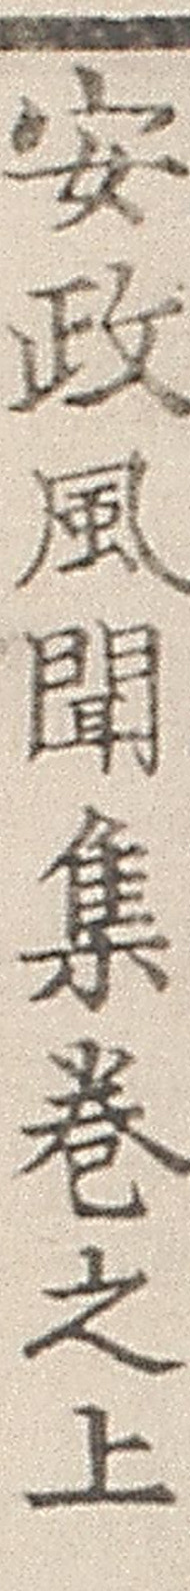安政風聞集巻之上
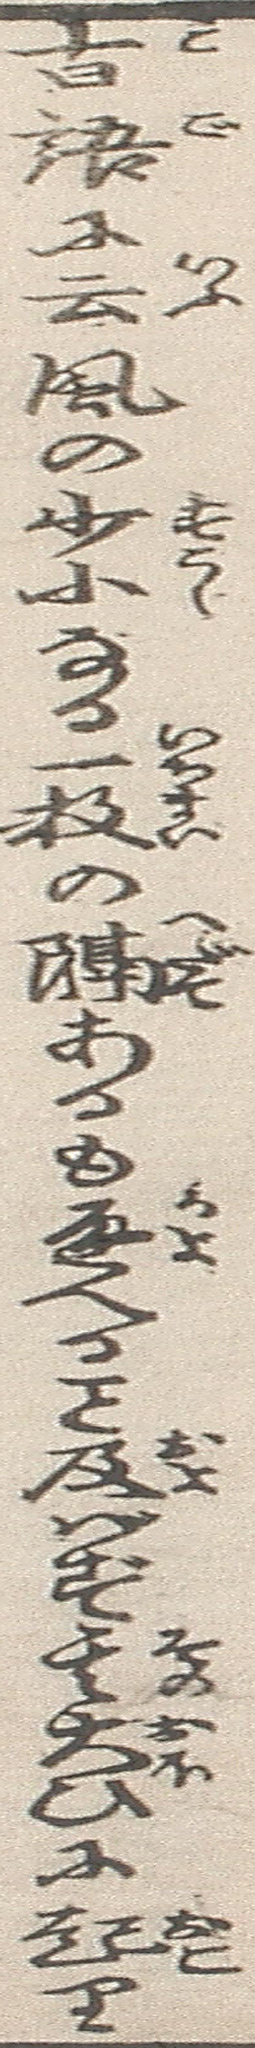古語に云風の少になる一枚の隔あるも通へること及バず其大ひに起り
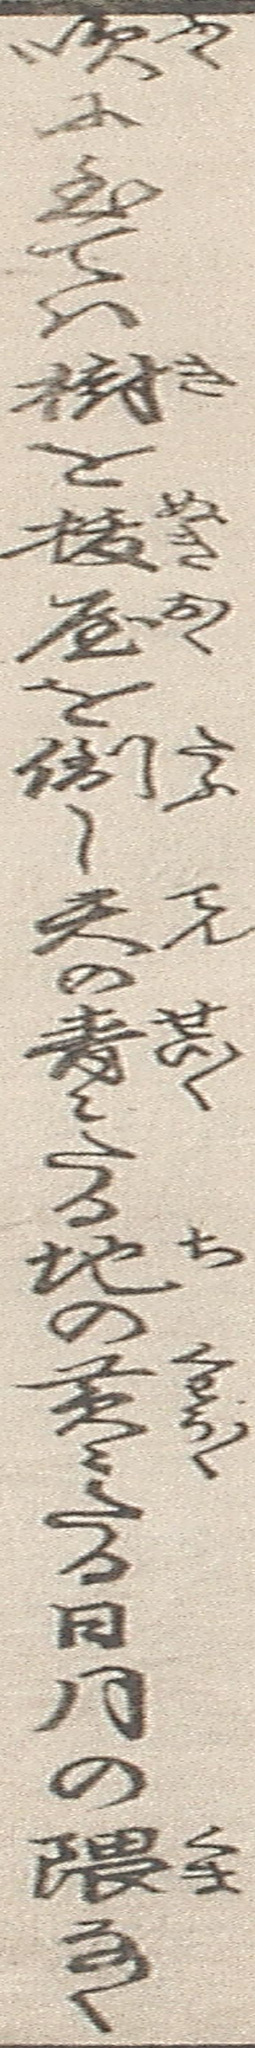吹に至てハ樹を抜屋を倒し天の青々たる地の黄々たる日月の隈なく
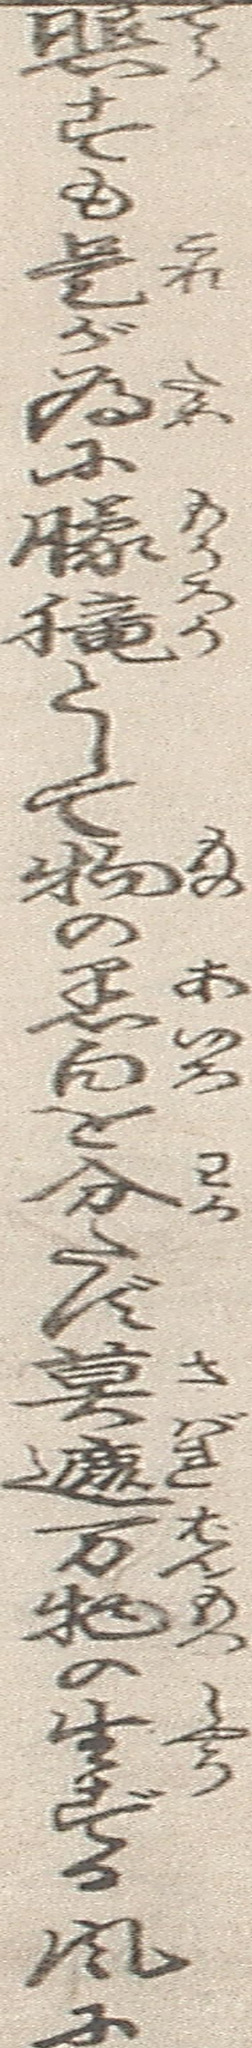照すも是が為に朦朧として物の黒白を分たず莫遮万物の生ずる風に
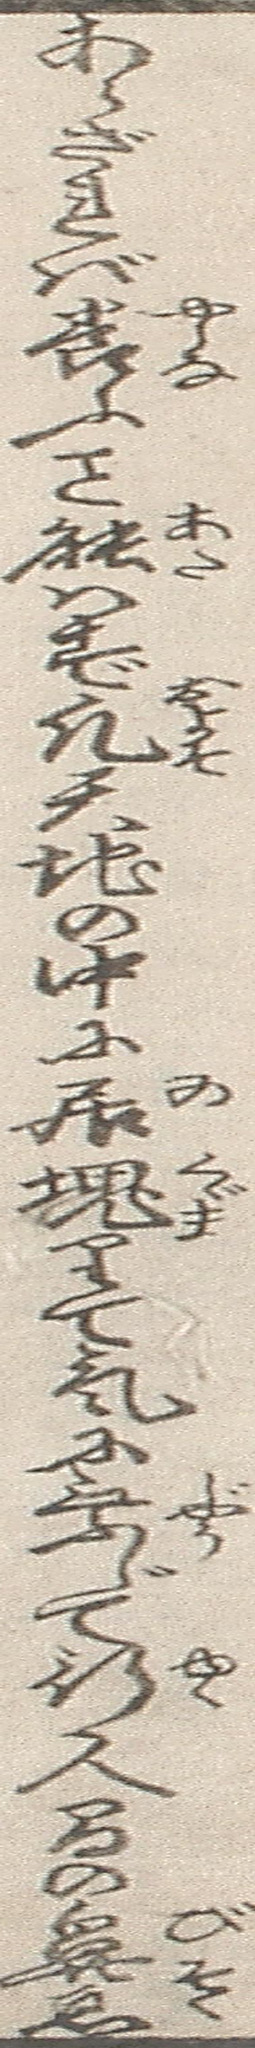あらざれバ養ふこと能ハず凡天地の中に居塊りて気に乗じて行人間の鼻息
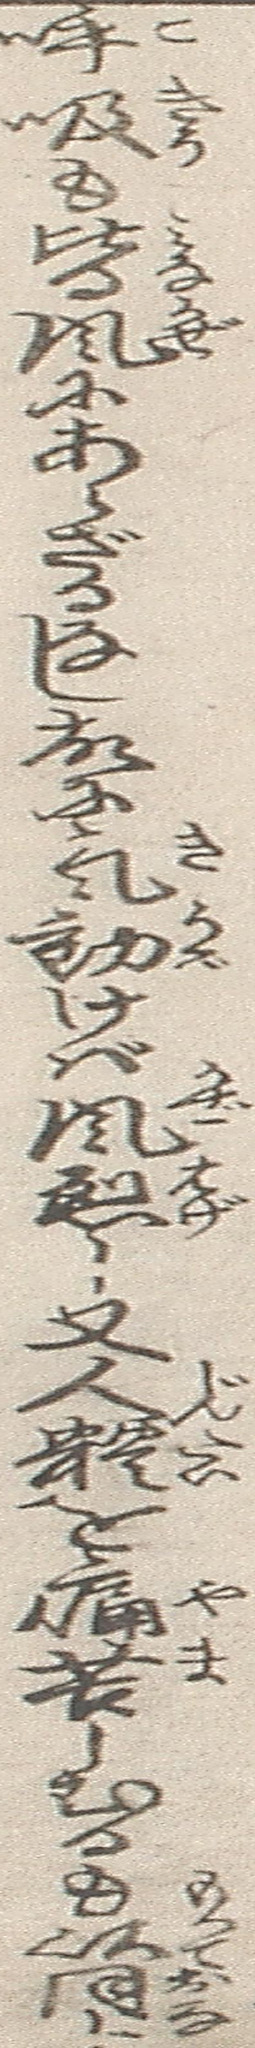呼吸も皆風にあらざるなし故に気動けバ風烈し又人体を痛苦しむるも以同し
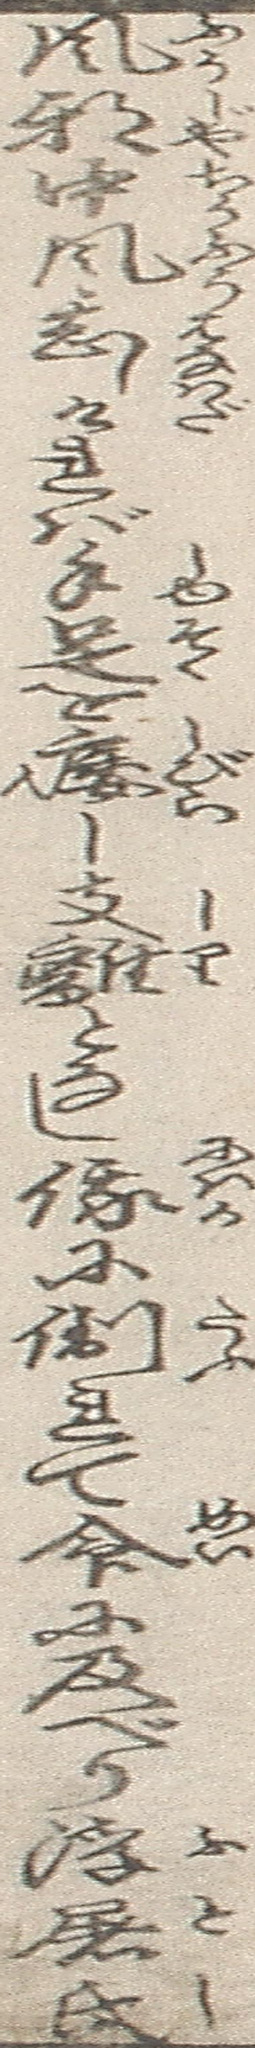風邪中風甚けれバ手足を痺し支離となし俄に倒れて命に及べり浮屠氏
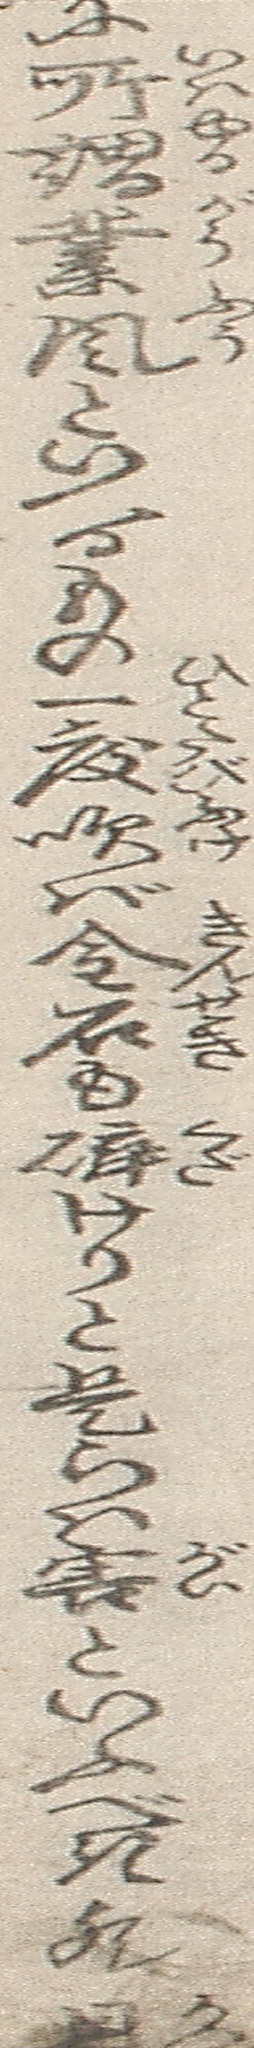に所謂業風といへるもの一度吹バ金石も碎けりと是らハ害といふべき歟且
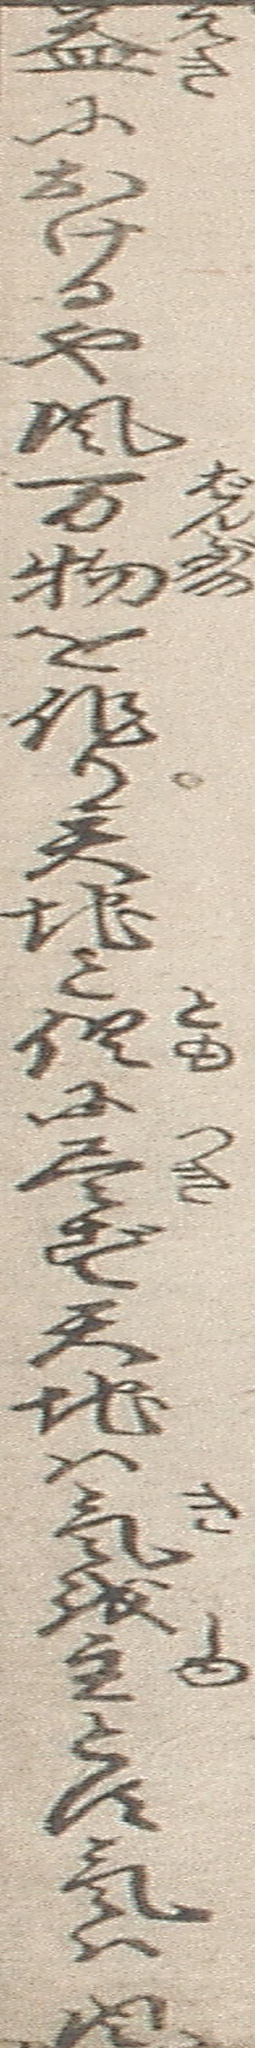益におけるや風万物を作り天地を俚に盡ず天地ハ気を主とす気ハ風

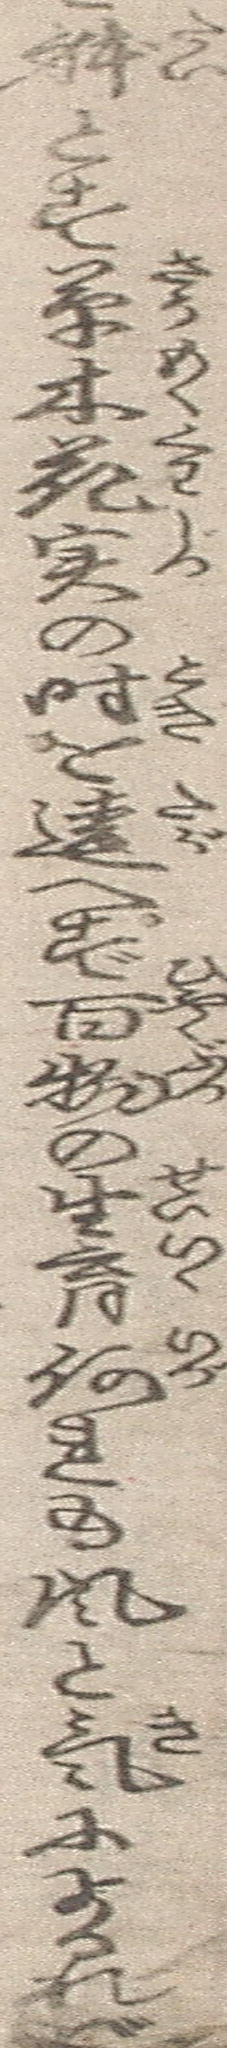を体とす草木花実の時を違へず百物の生育何れも風と気によかれバ
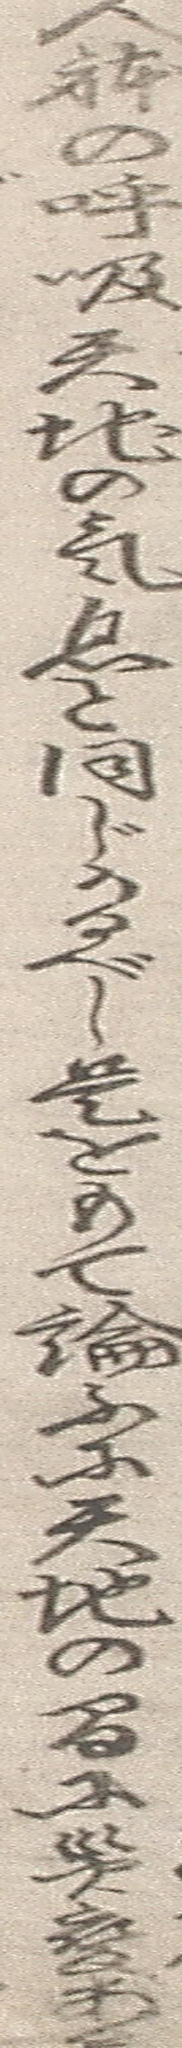人体の呼吸天地の気息と同じかるべし是をもて論ふに天地の間に災変あり
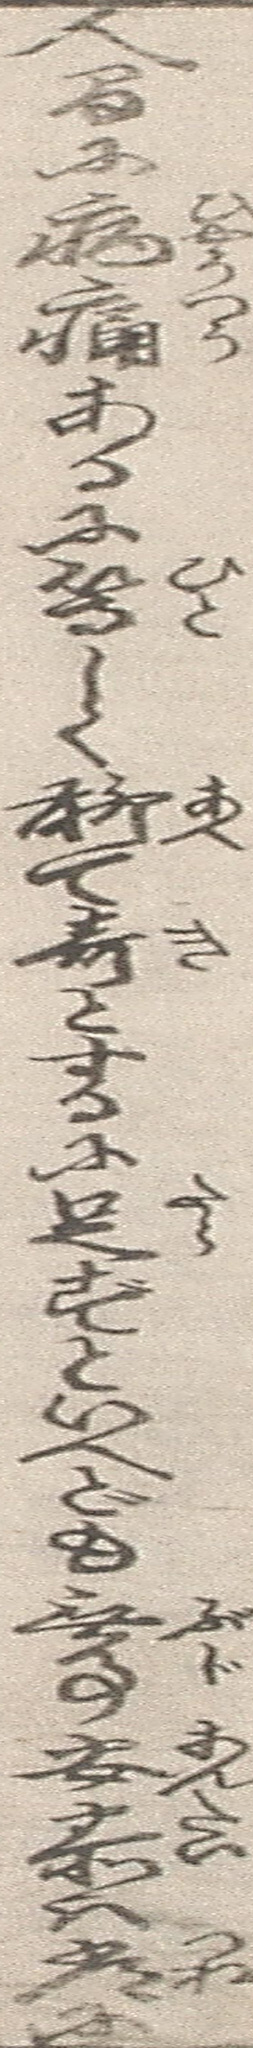人間に病痛あるに等しく敢て奇とするに足すといへども無事安泰ハ常に
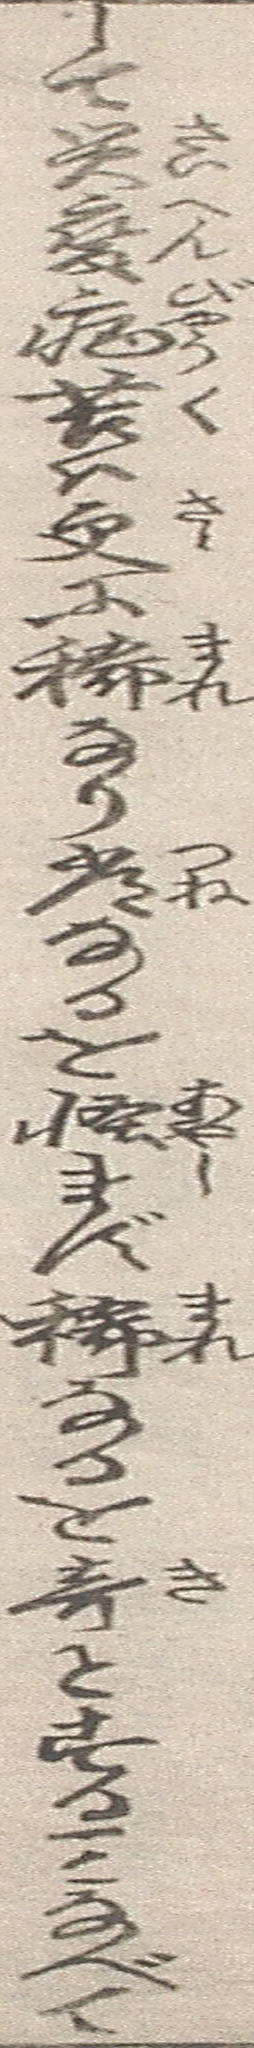して災変病苦ハ更に稀なり常なるを怪まず稀なるを奇とすることなべて
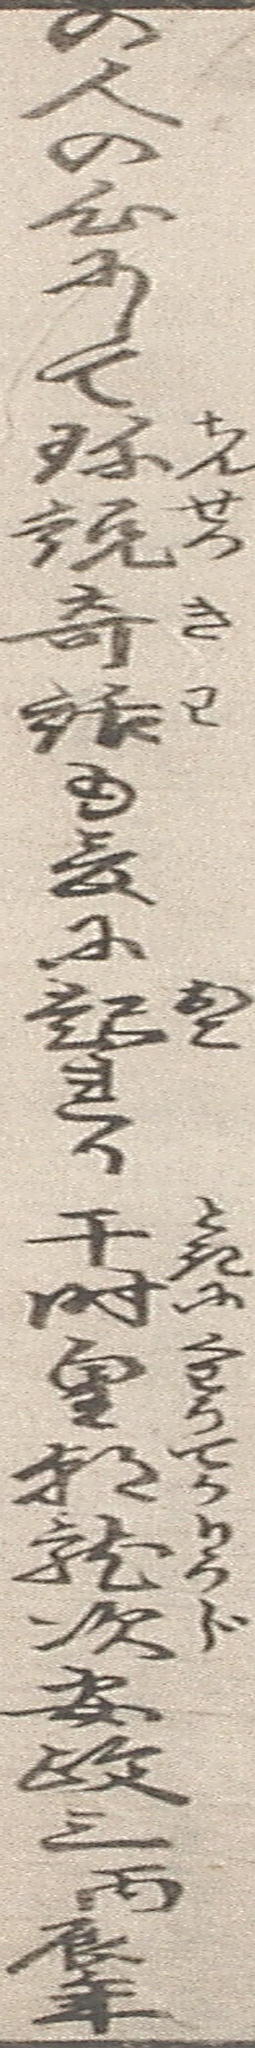の人の心にて珍説奇話も爰に起れり干時皇朝龍次安政三丙辰年
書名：安政風聞集　上中下　全
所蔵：東京大学地震研究所図書室 Earthquake Research Institute Library, The University of Tokyo, JAPAN
